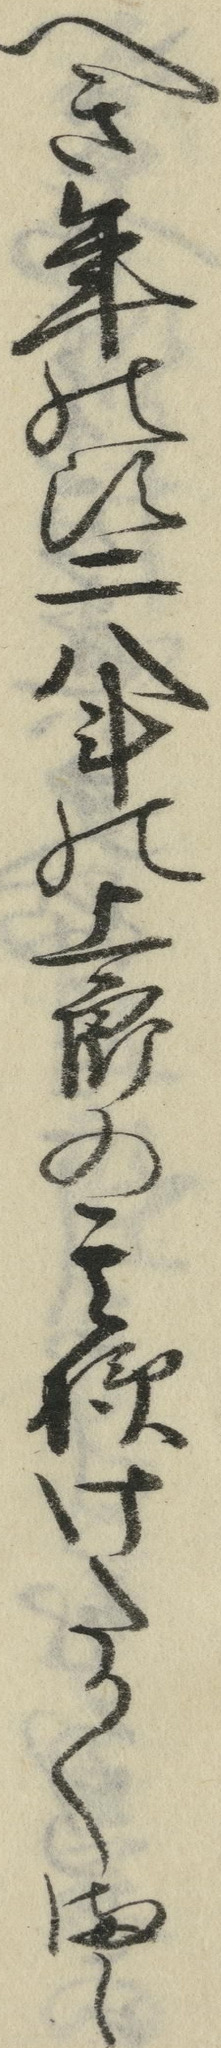へき年の頃二八斗の上郎の其様けたかくまし
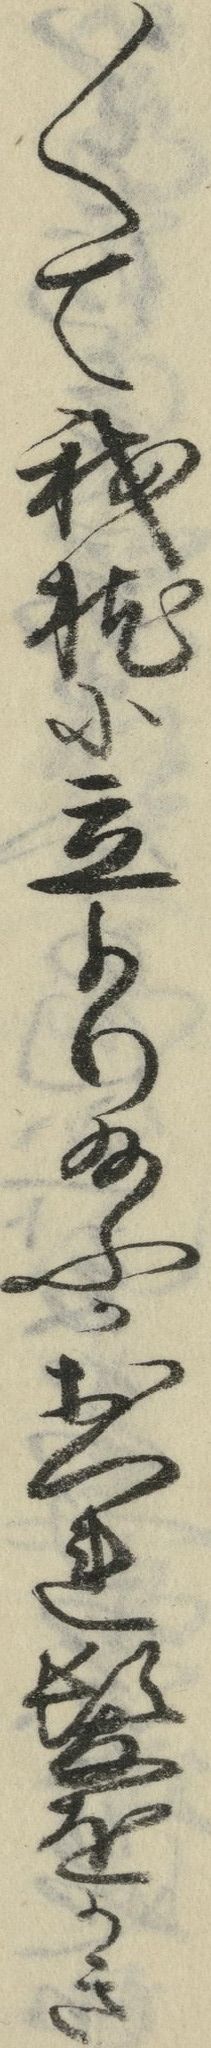〳〵て我枕に立より給ふかおくれ髪をかき
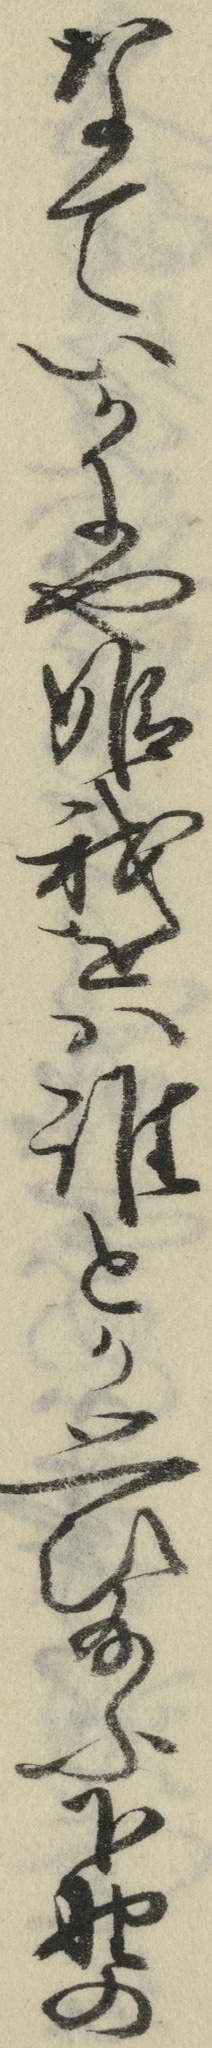なていかにや姫我をハ誰とか思ひ給ふ下野の
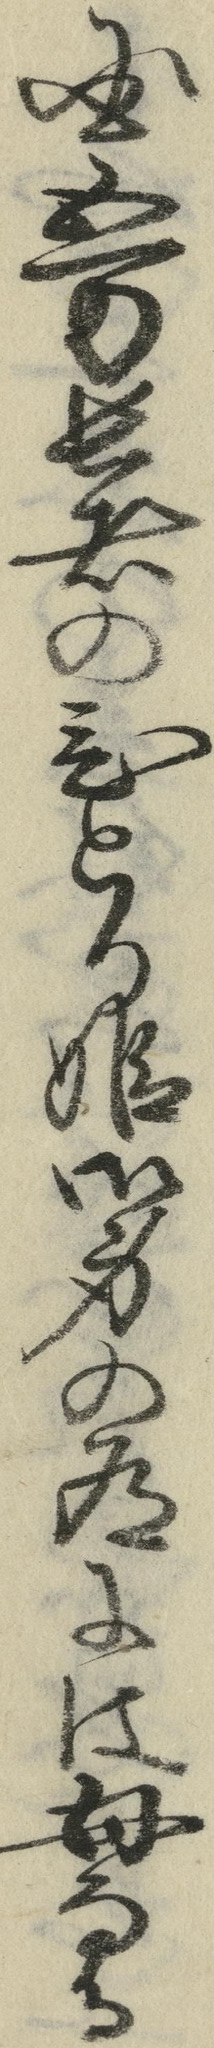国五万長者のひとり姫御身の為には母なる
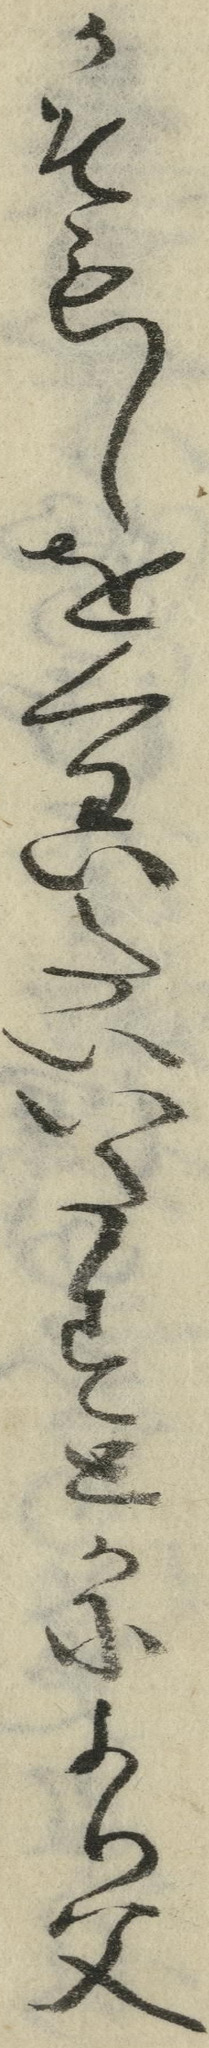かそもしをくわいたいいたすとかにより父
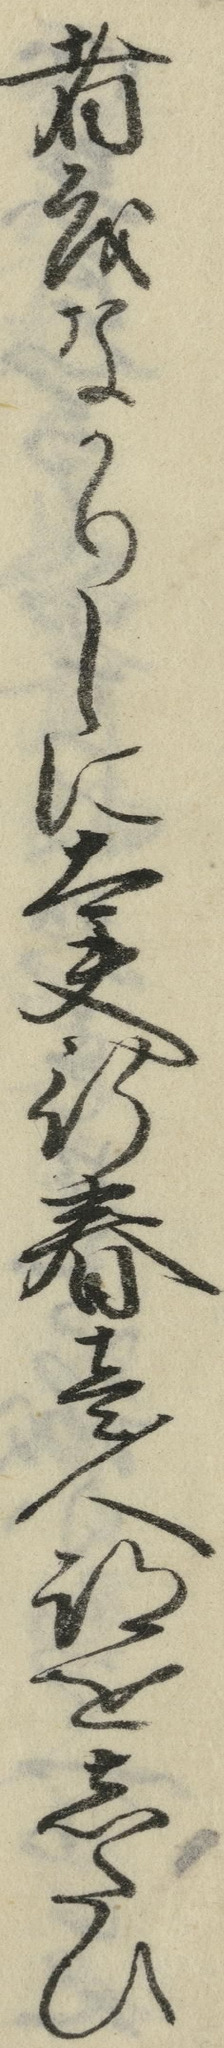者もなかりしに太夫行春壱人跡をしたひ
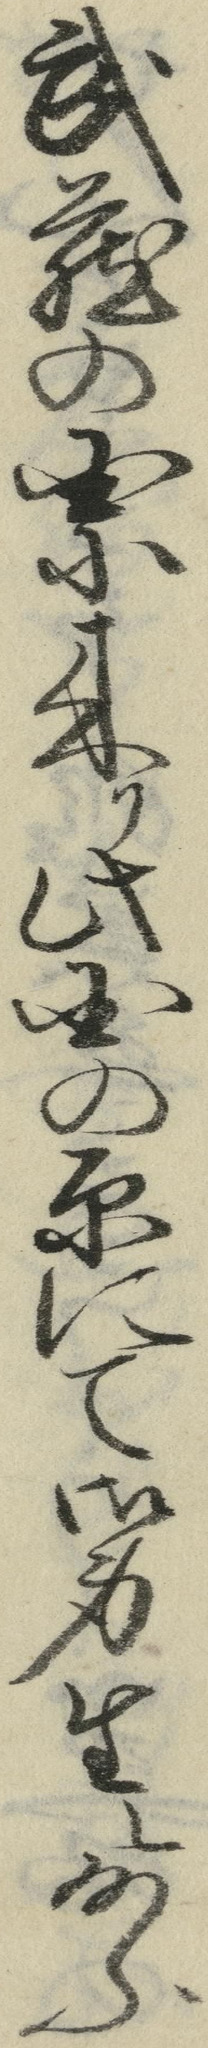武蔵の国に来リ此国の原にて御身生レ給ふ
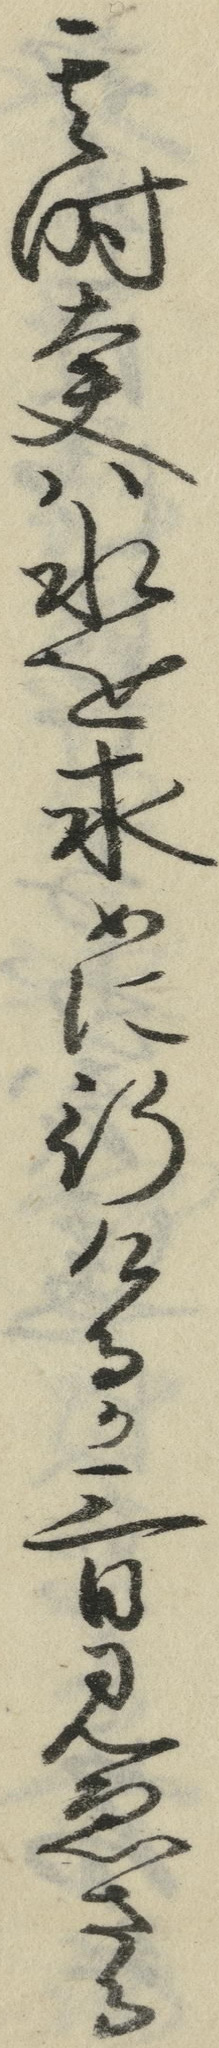其時大夫ハ水を求めに行けるか三日見ゑさる
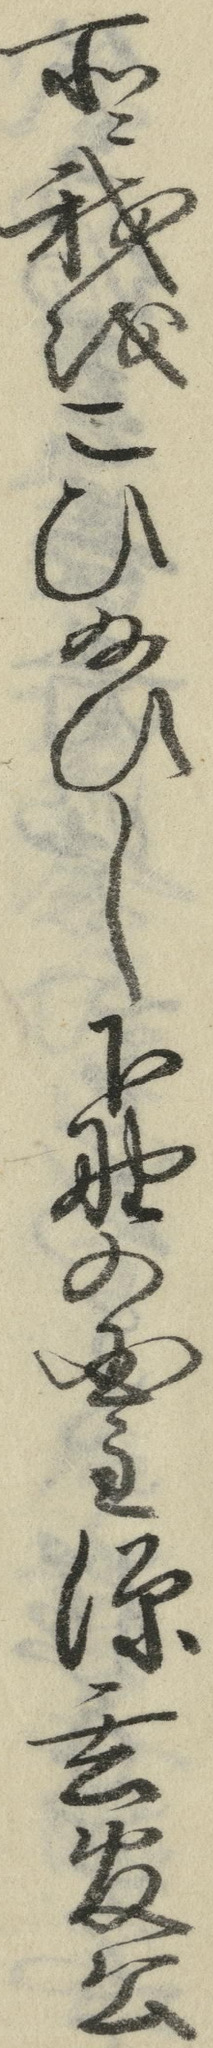所ニ我をこひ給ひし下野の国主源玄官公
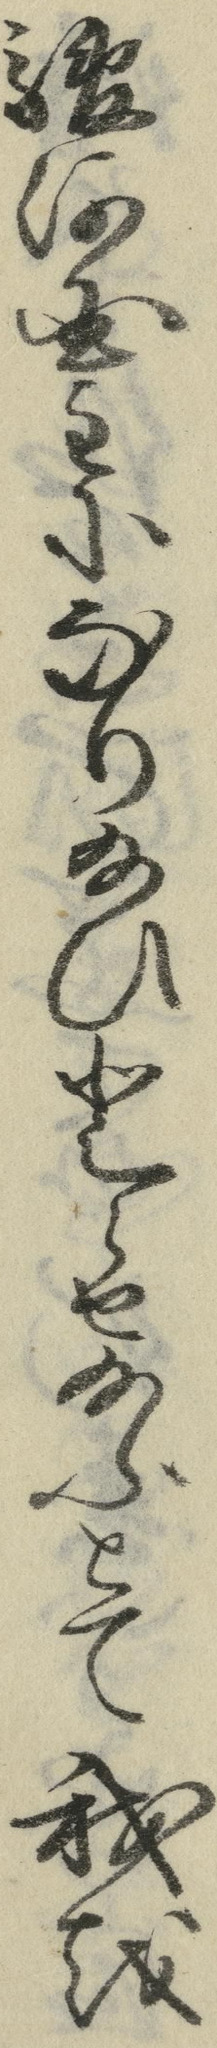駿河国主になり給ひ登らせ給ふとて我を
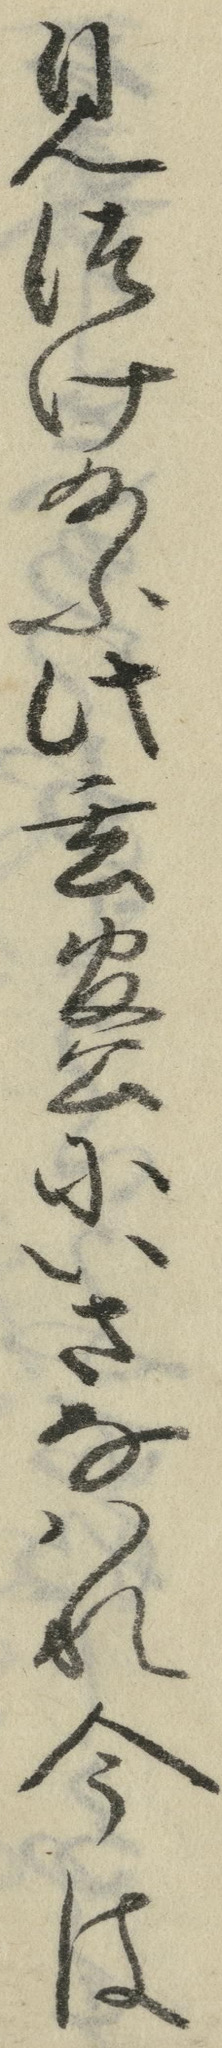見つけ給ふ此玄官公にいさなハれ今は
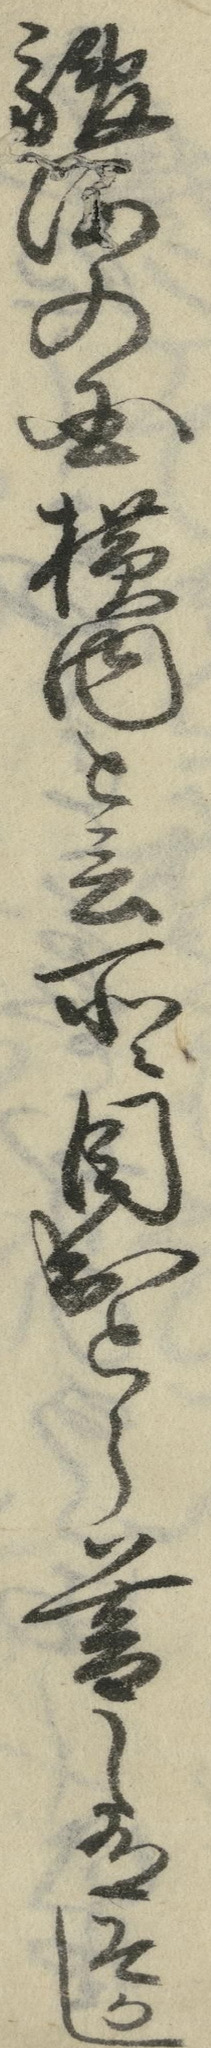駿河の国横内と言所ニ目出とう暮し有そかし
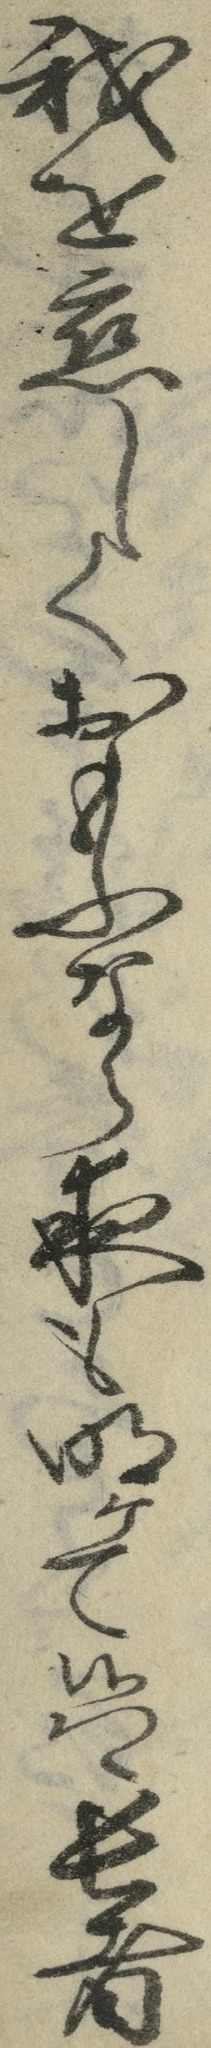我を恋しくおもふなら夜も明ケて候ハゝ長者

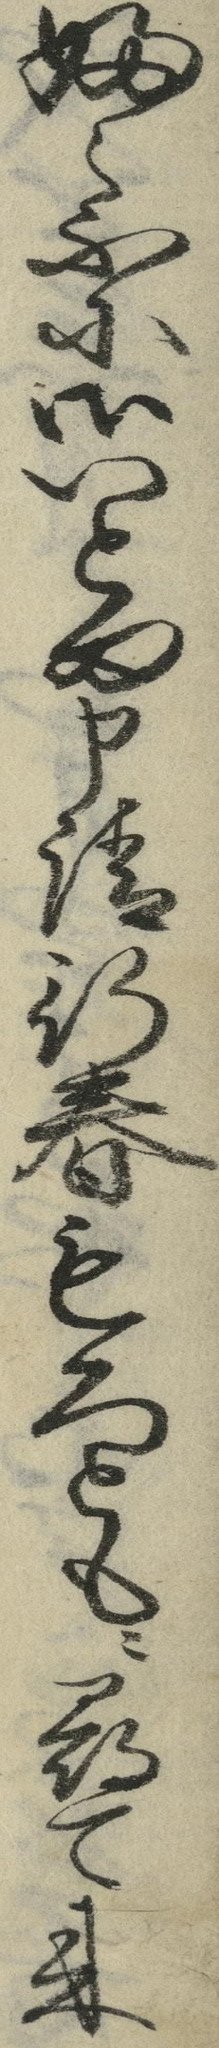ふうふに御いとま申請行春もろともニ尋て来
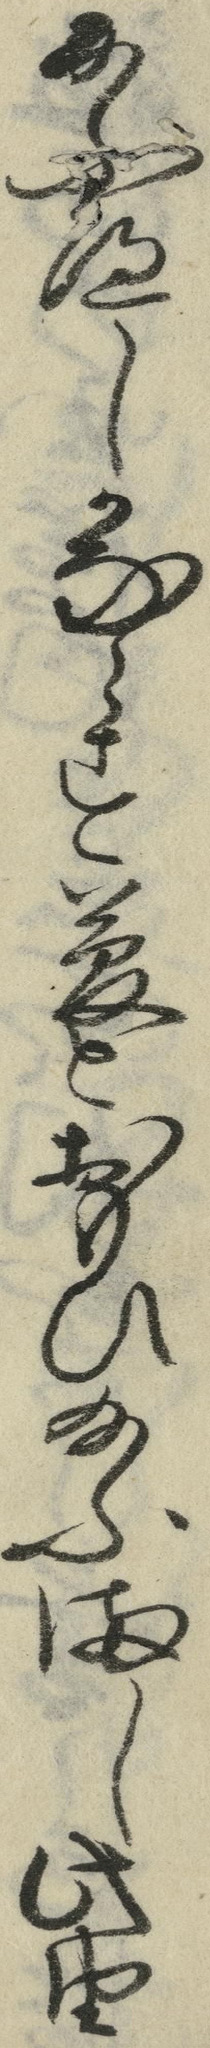給ふへしかならす夢とおもひ給ふまし此由
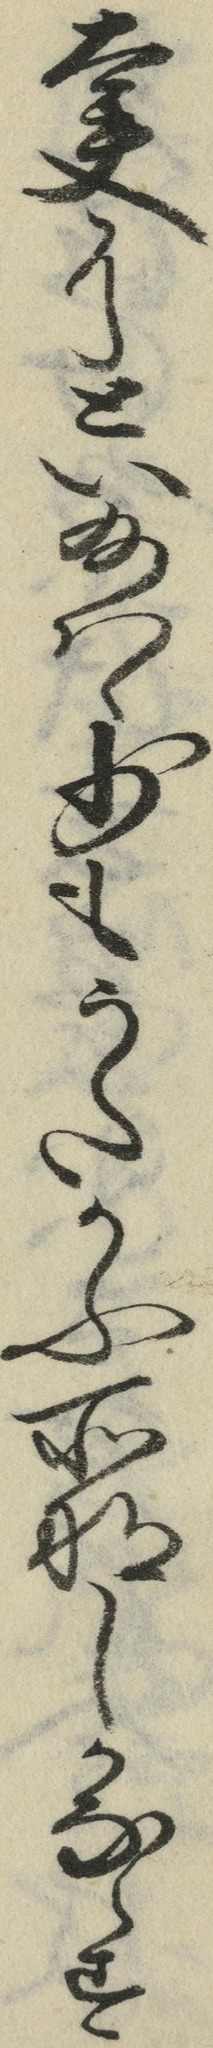太夫にとい給ハゝ少もうたかふ所なしかならす
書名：浅間記
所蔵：東京大学地震研究所図書室 Earthquake Research Institute Library, The University of Tokyo, JAPAN
